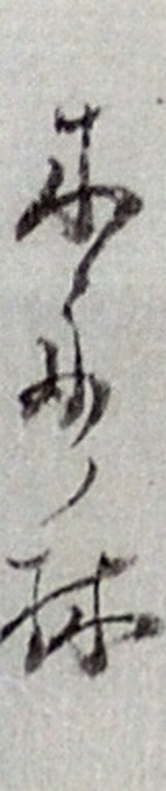木舟ノ林
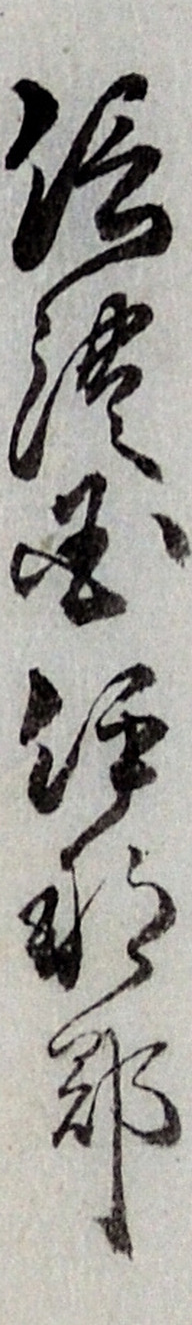信濃国伊那郡
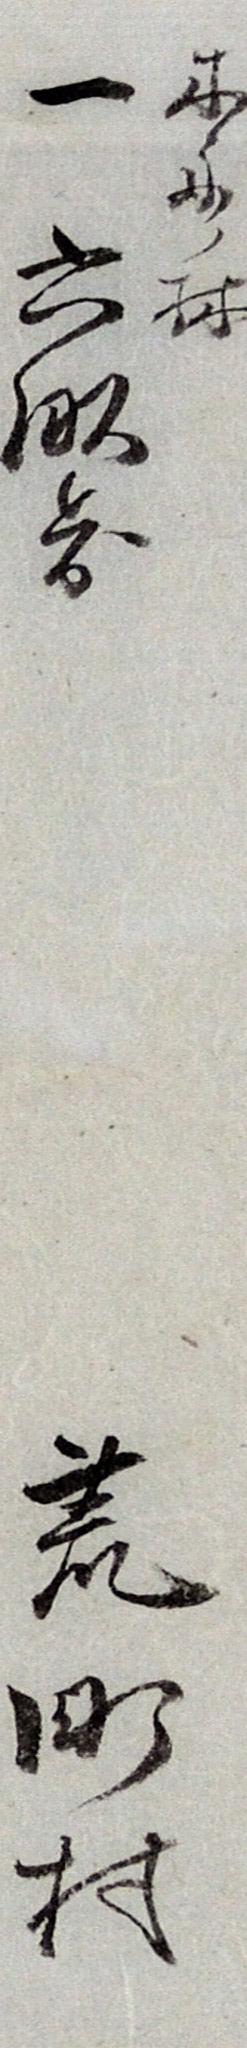一六㽗歩荒町村
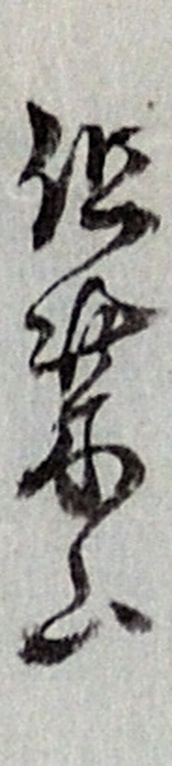但柴山
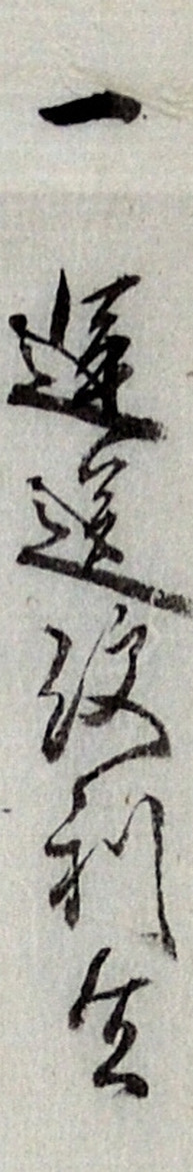一運送便利宜
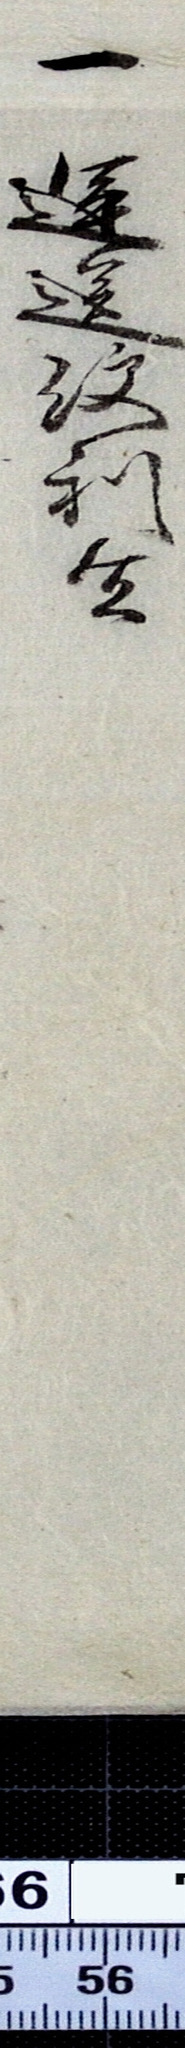一運送便利宜
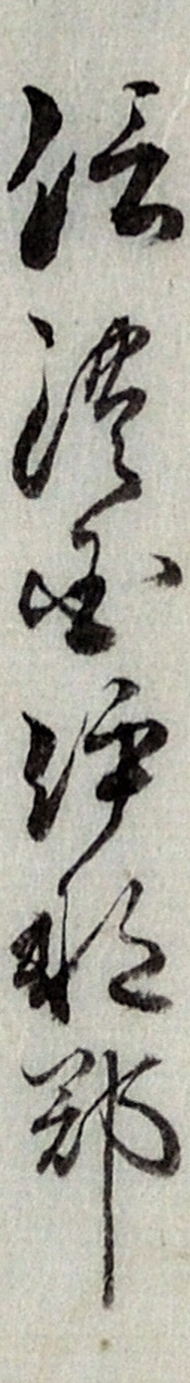信濃国伊那郡
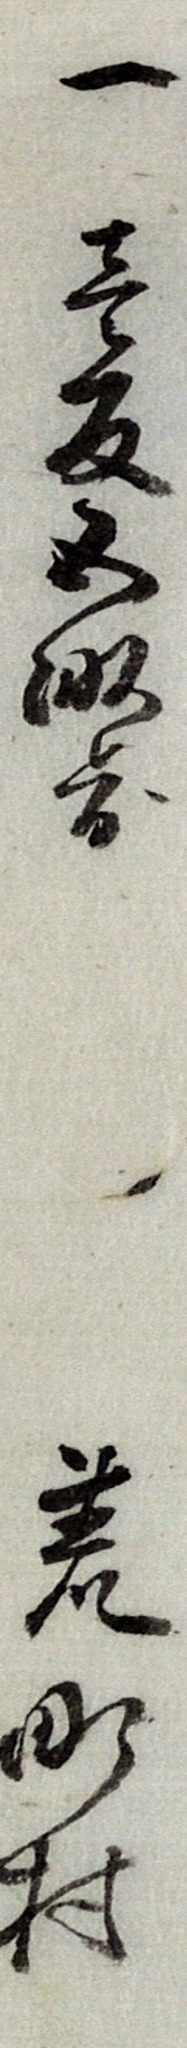一壱反五㽗歩荒町村
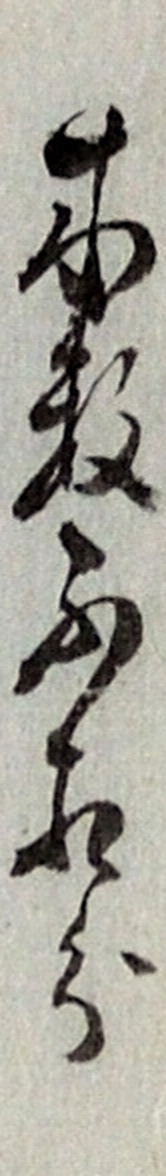木数不相分
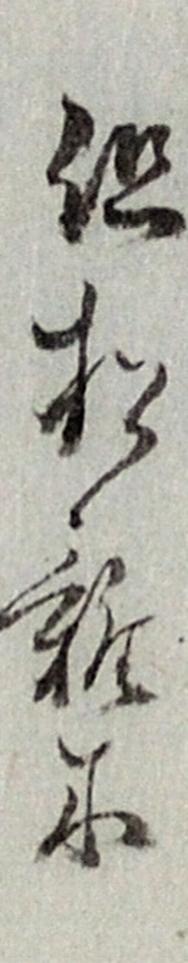但松雑木
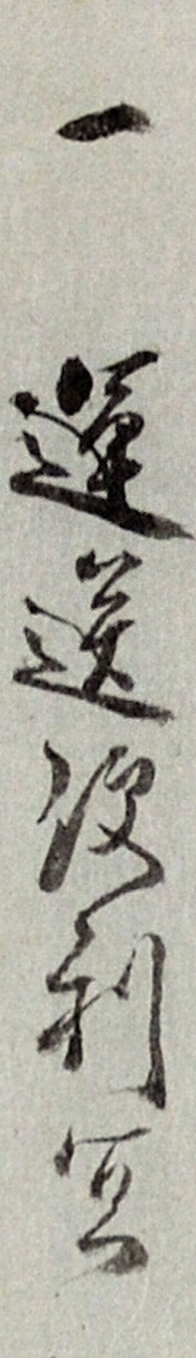一運送便利宜
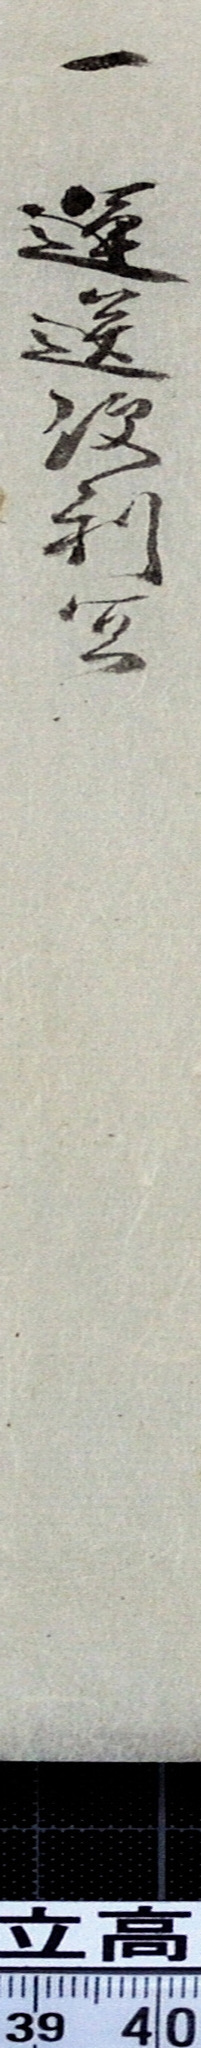一運送便利宜

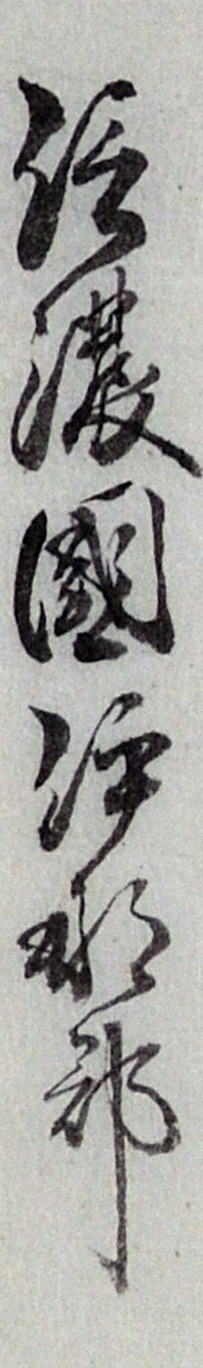信濃国伊那郡
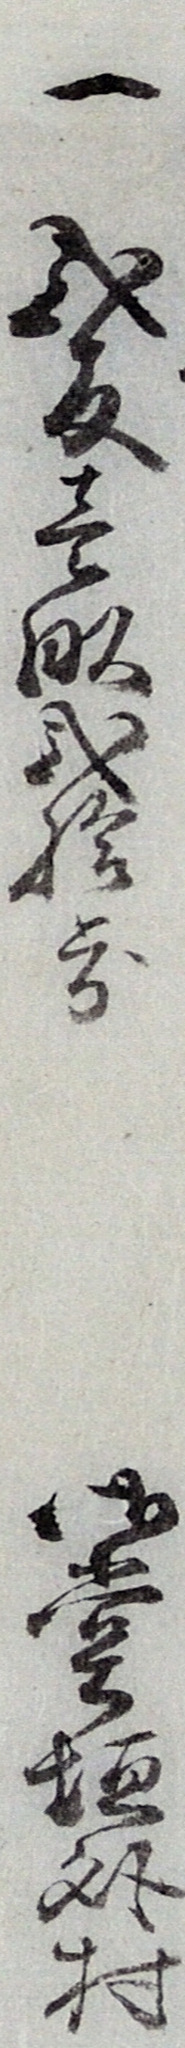一弐反壱㽗弐拾歩御堂垣外村
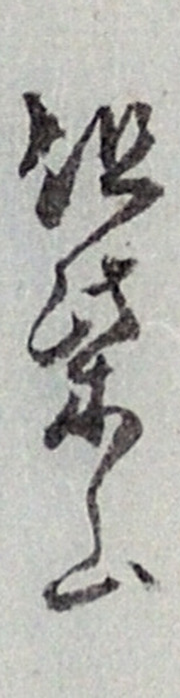但柴山
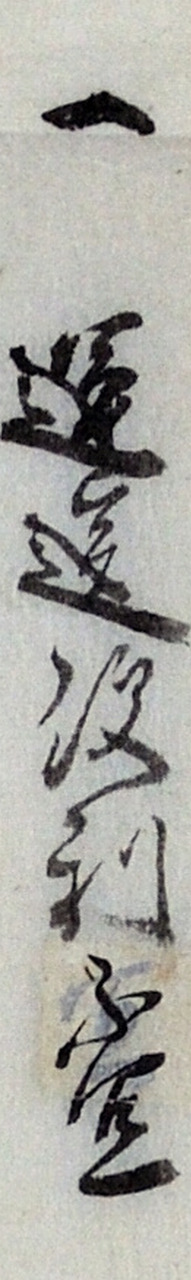一運送便利不宜
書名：官林反別帳
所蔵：伊那市立高遠町図書館・合同会社AMANE
